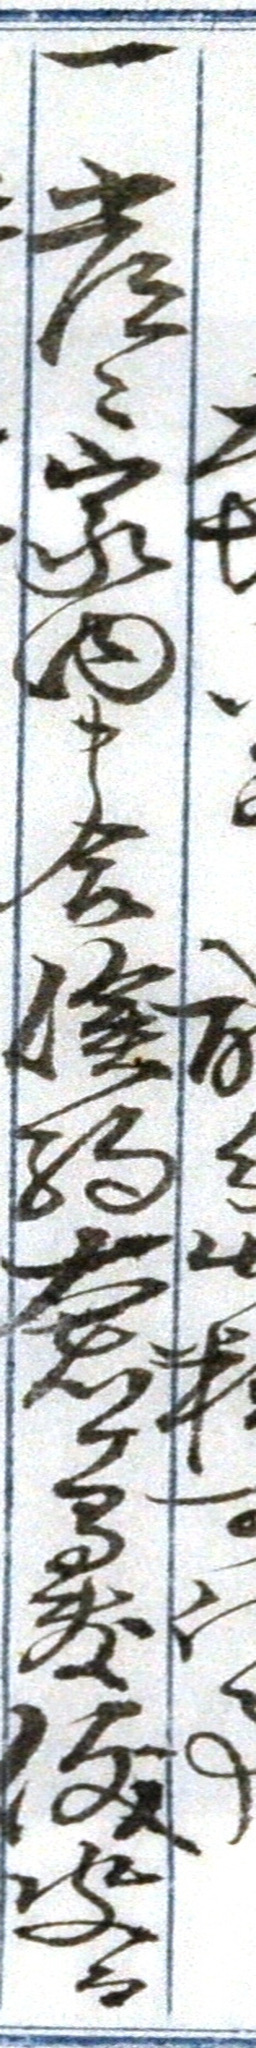一常々家内申合倹約奢ケ間敷儀決而
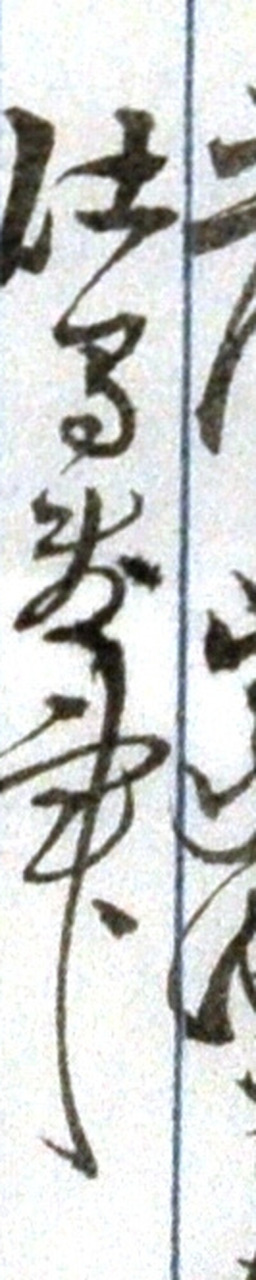仕間敷事
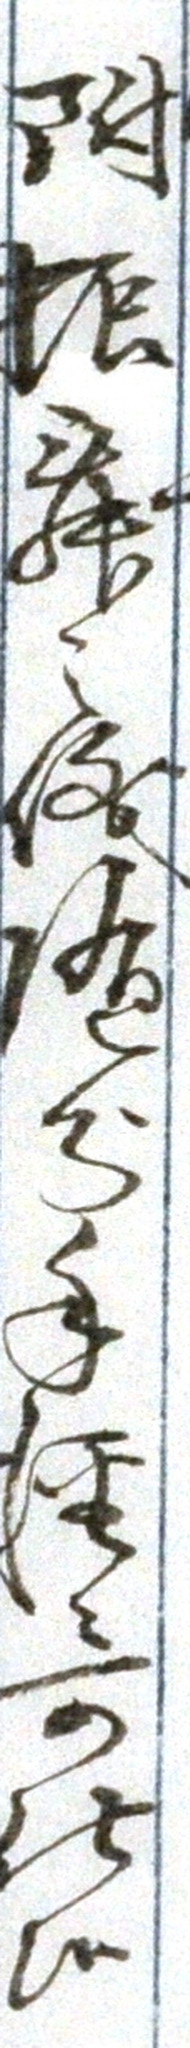附振舞之儀随分手軽ニ可仕候
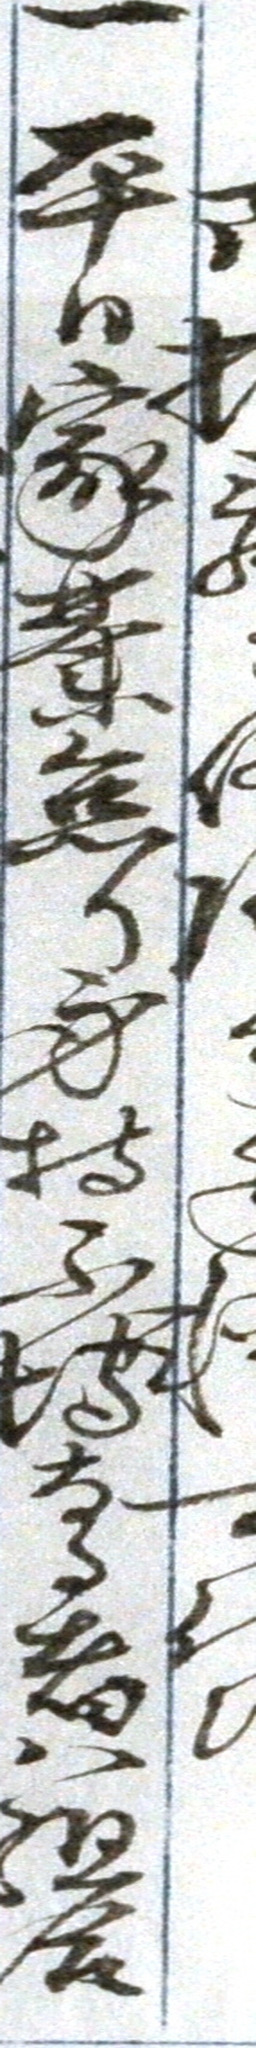一平日家業怠り身持不埒なる者ハ組合
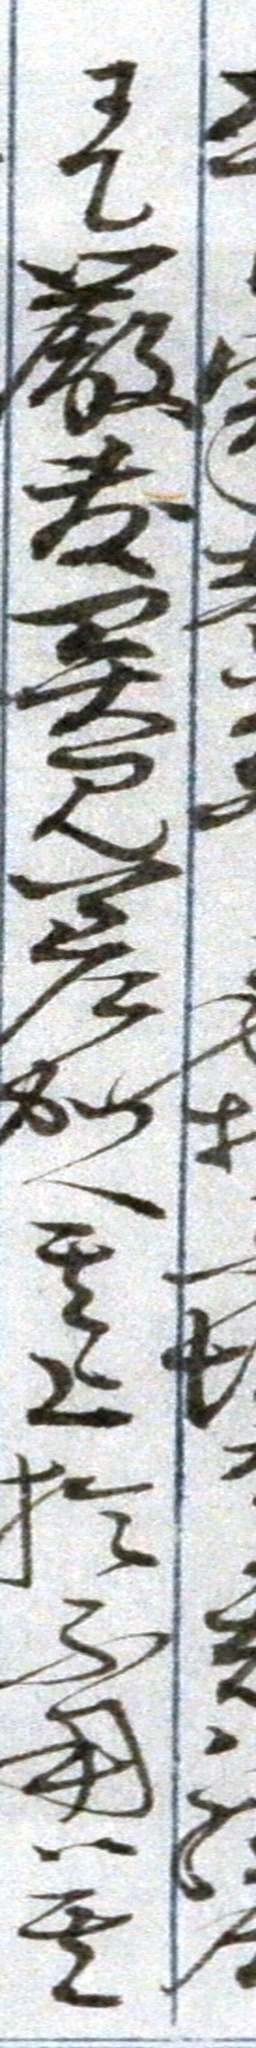にて厳敷異見差加へ其上於不用ハ其
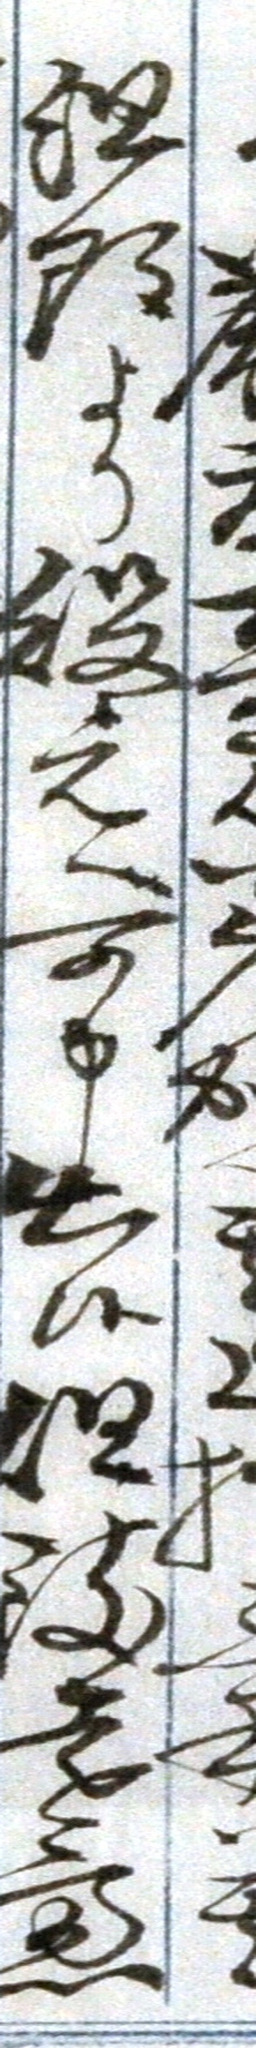組頭より役元へ可申出候但致遠慮
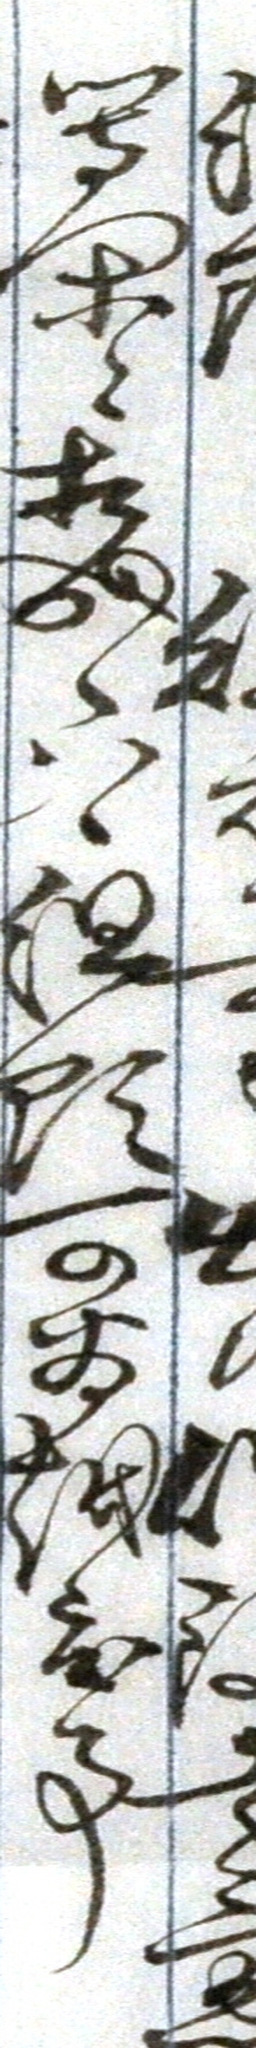等閑ニ相成候ハゝ組頭可為越度事
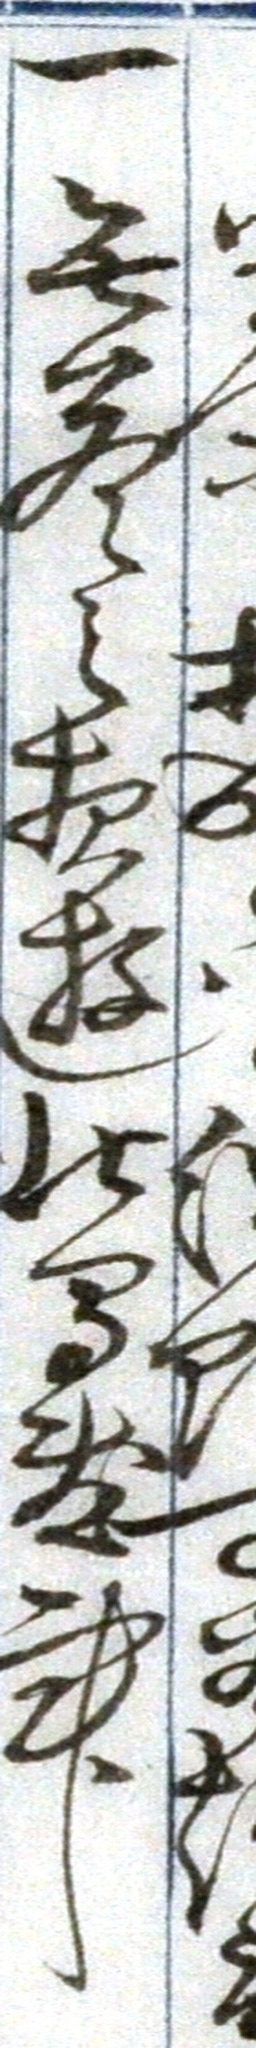一無尽之夜遊仕間敷事
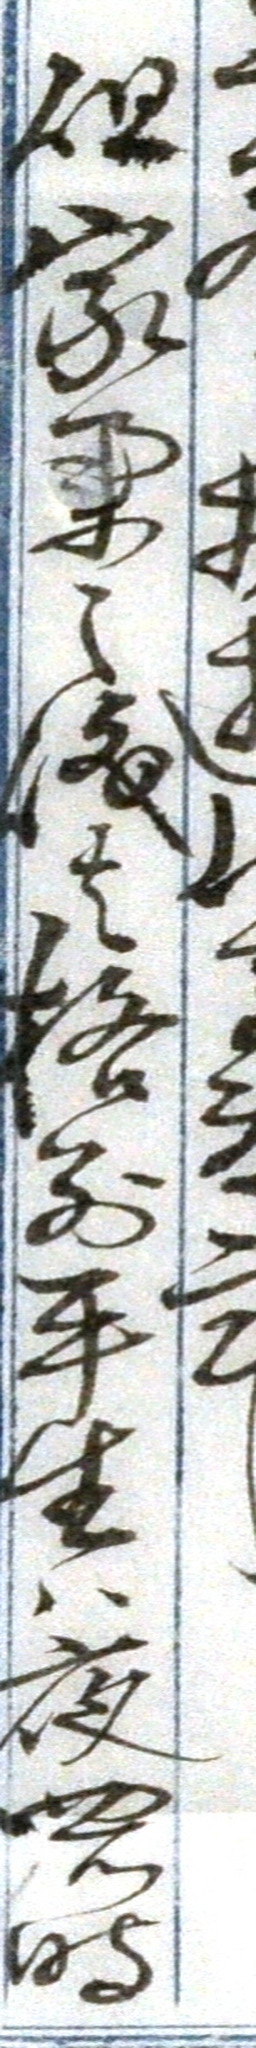但家業之儀者格別平生ハ夜四ツ時
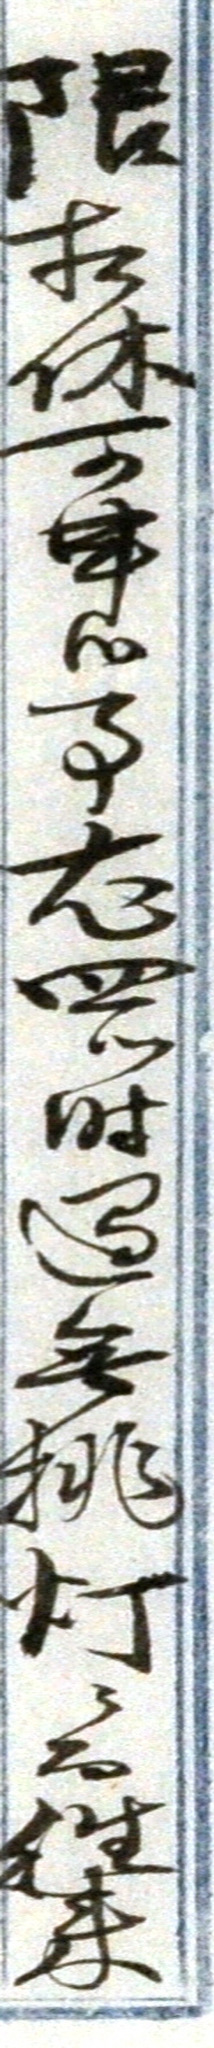限相休可申候事尤四ツ時過無挑灯ニ而往来
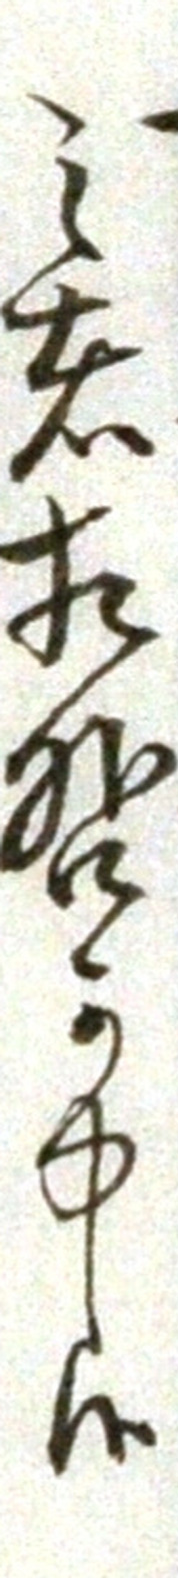之者相咎可申候
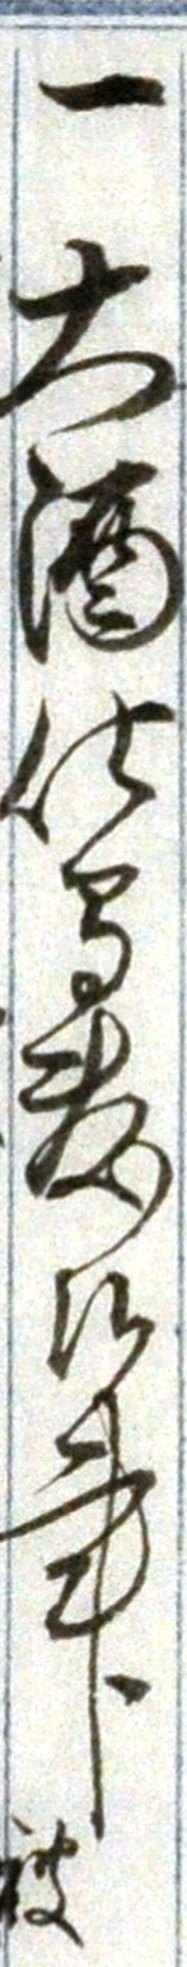一大酒仕間敷候事
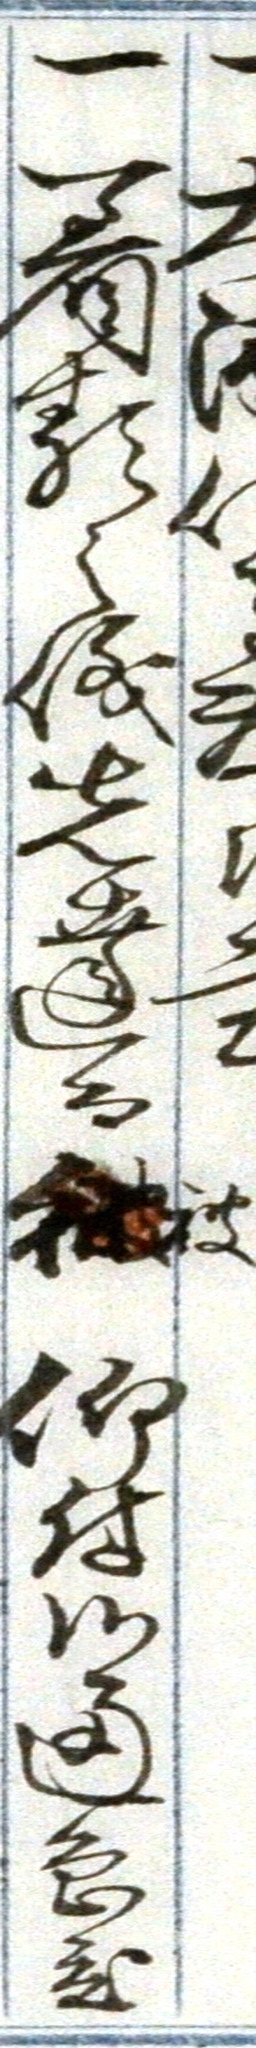一着類之儀先達而被仰付候通急度
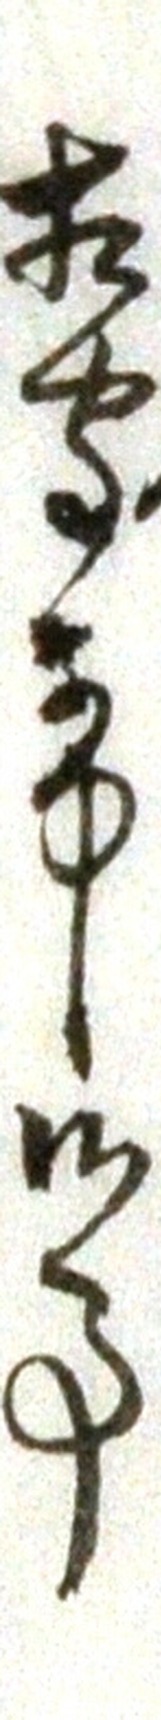相守可申候事
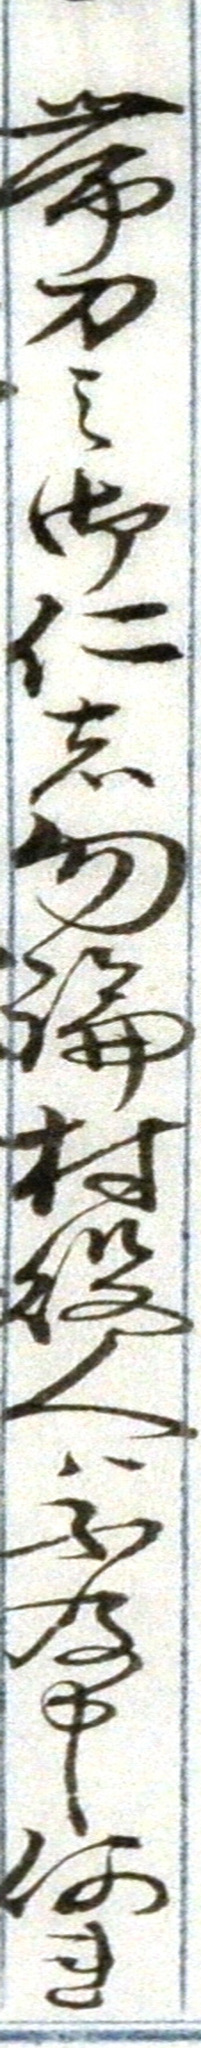一帯刀之御仁者勿論村役人ハ不及申何れ
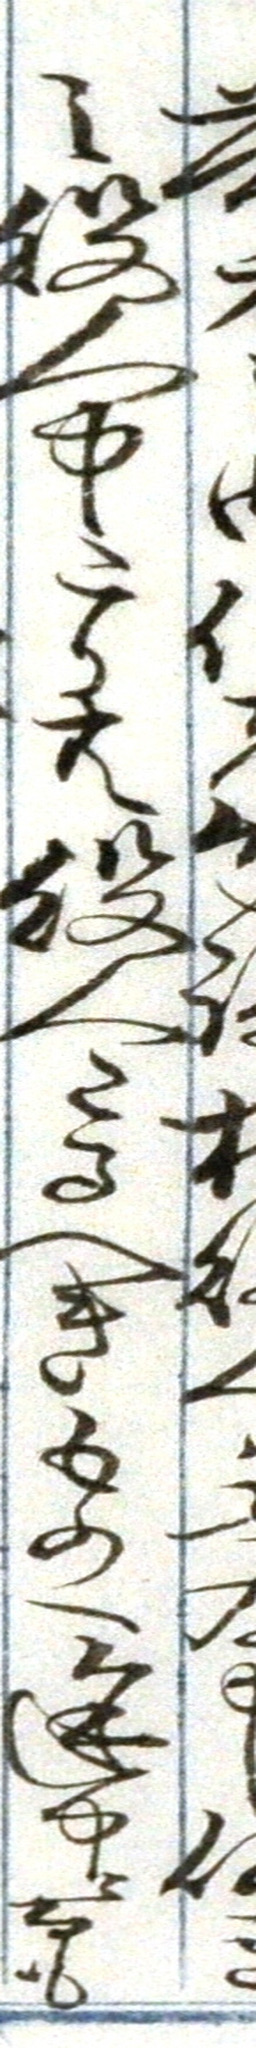之役人中たり共役人たるへきものへ連中ニ而も
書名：在町組合ヨリ差上候覚書
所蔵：伊那市立高遠町図書館・合同会社AMANE
